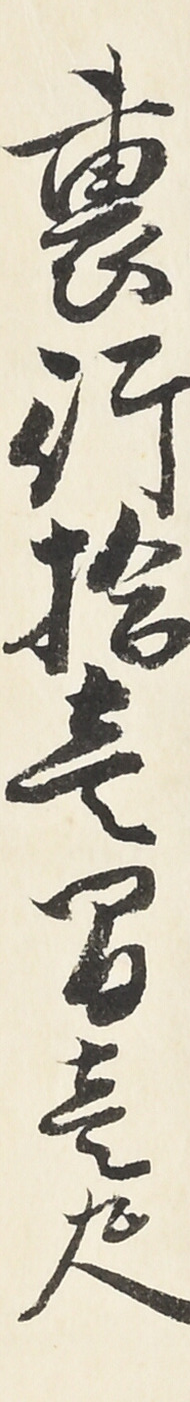裏行拾壱間壱尺
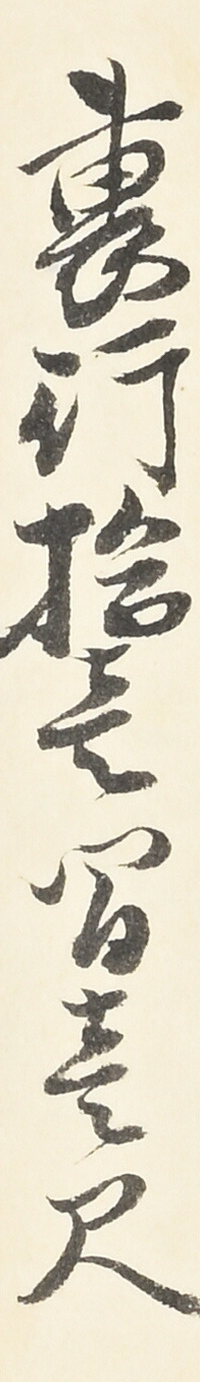裏行拾壱間壱尺
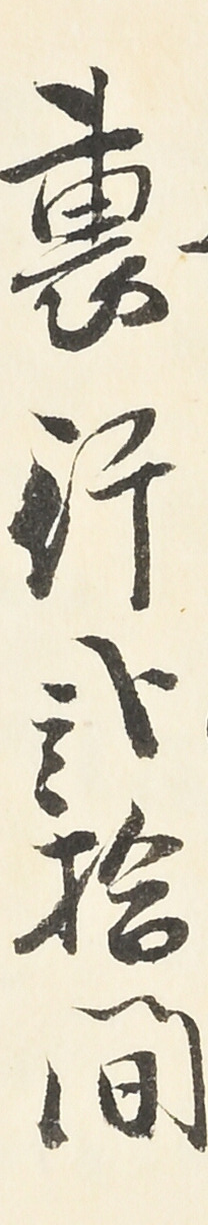裏行弐拾間
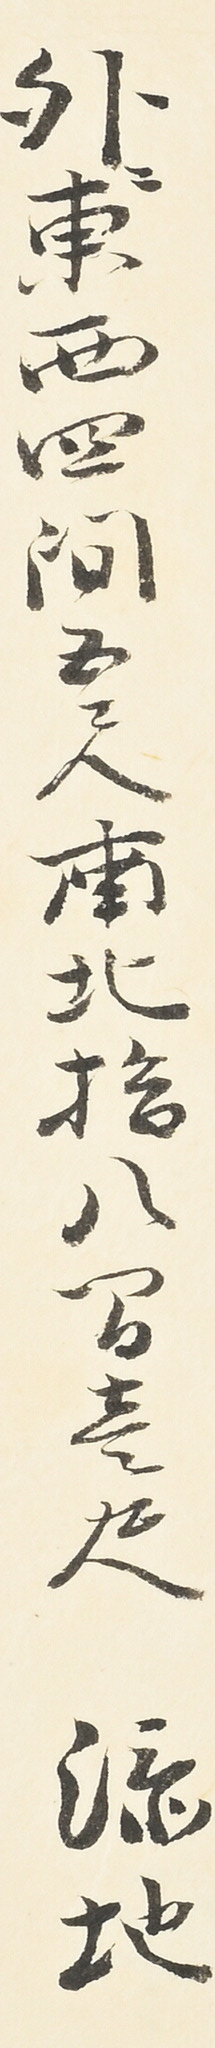外ニ東西四間五尺南北拾八間壱尺添地
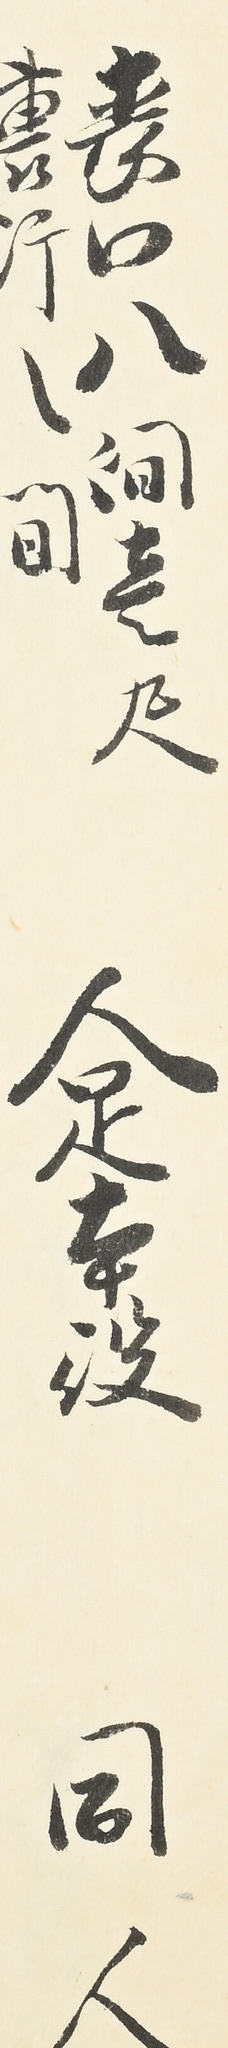一表口八間壱尺人足本役同人㊞
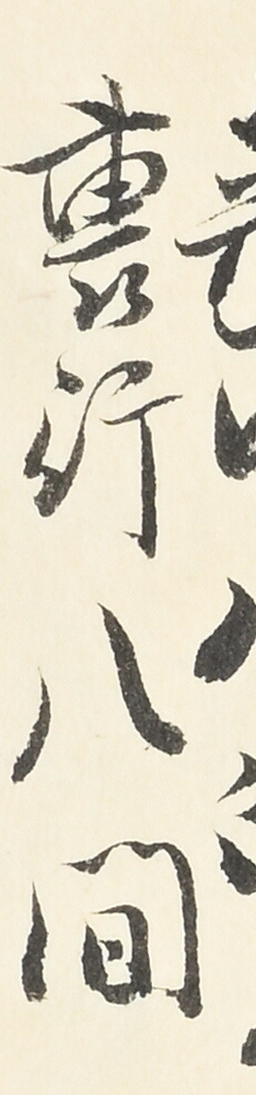裏行八間
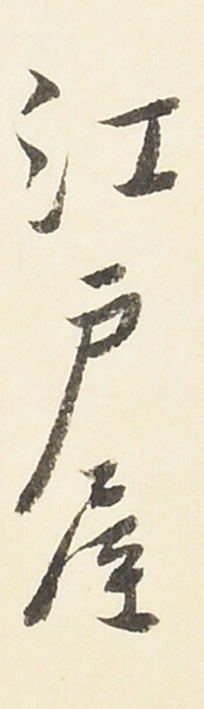江戸屋
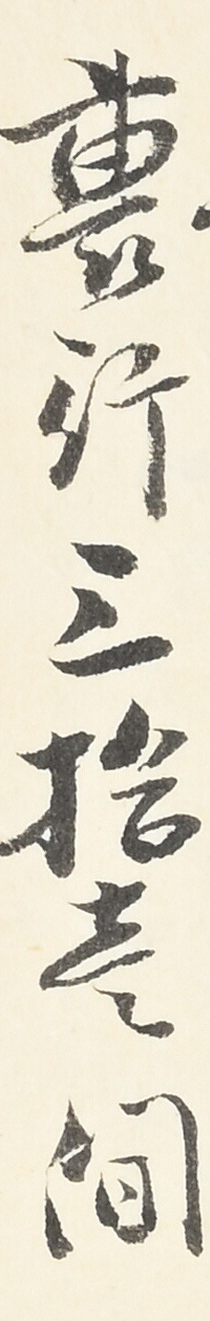裏行三拾壱間
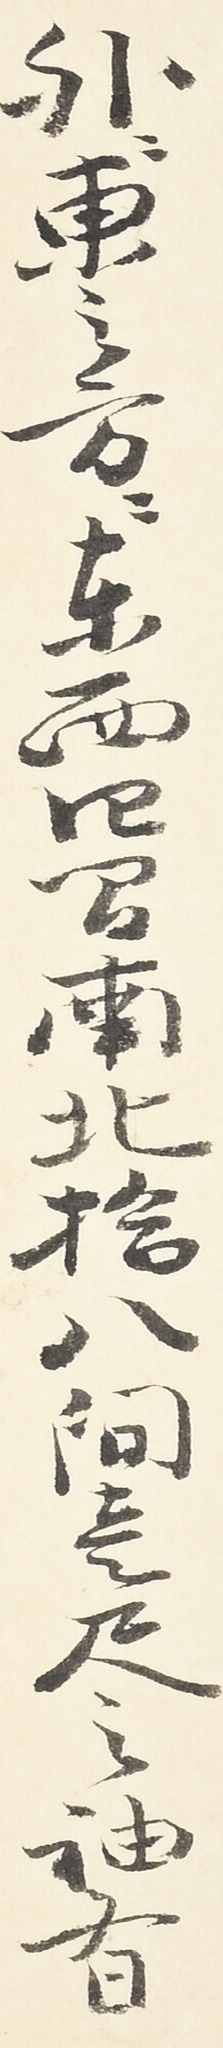外ニ東之方ニ東西四間南北拾八間壱尺之袖有

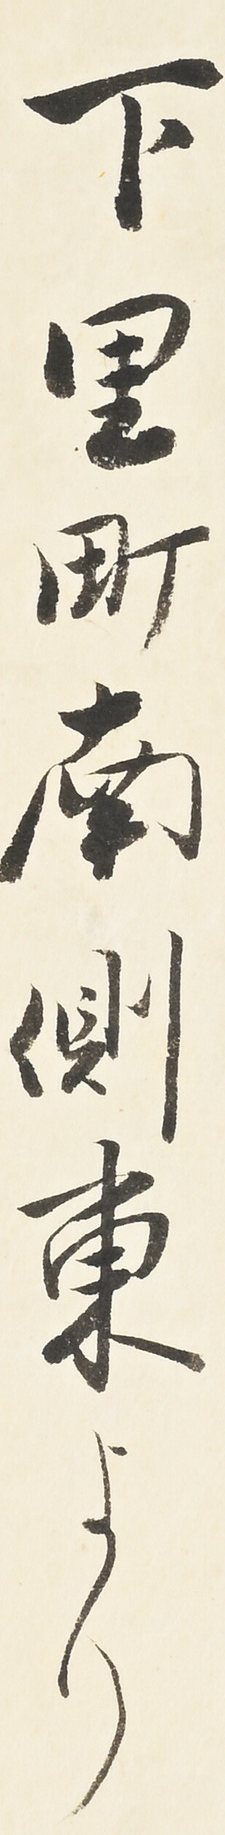下里町南側東より
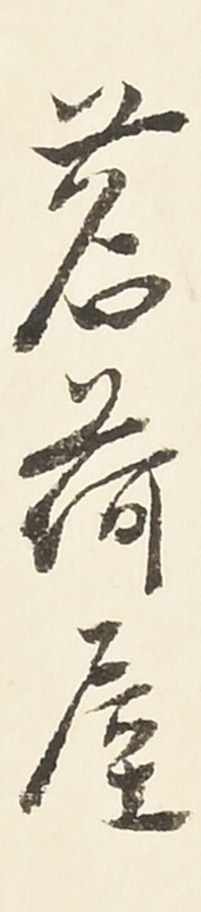茗荷屋
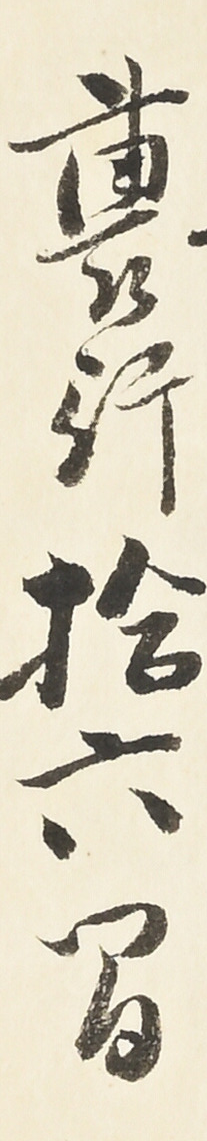裏行拾六間
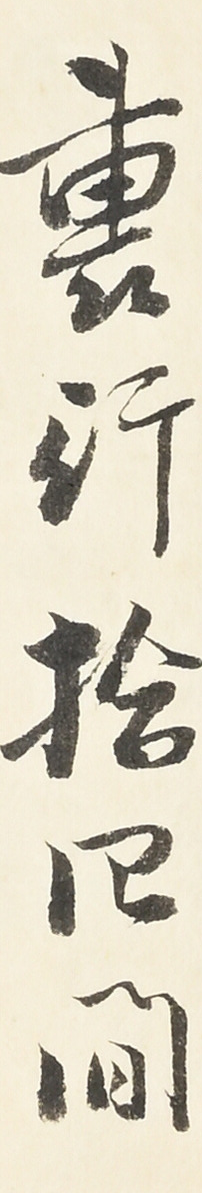裏行拾四間
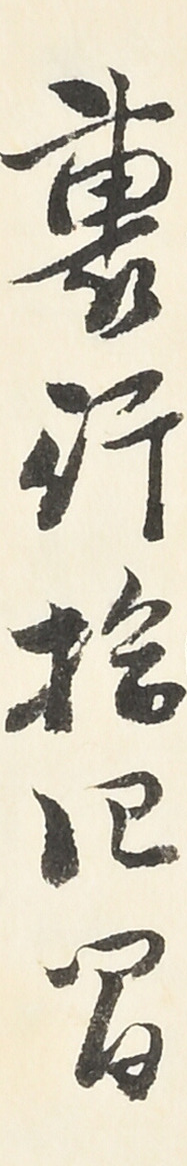裏行拾四間
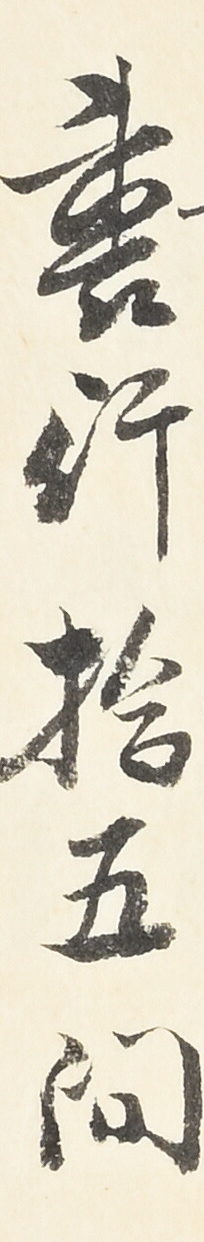裏行拾五間
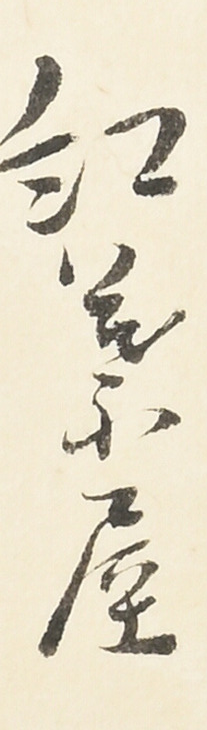紅葉屋
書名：高遠町家数并間数改帳
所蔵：伊那市立高遠町図書館・合同会社AMANE
